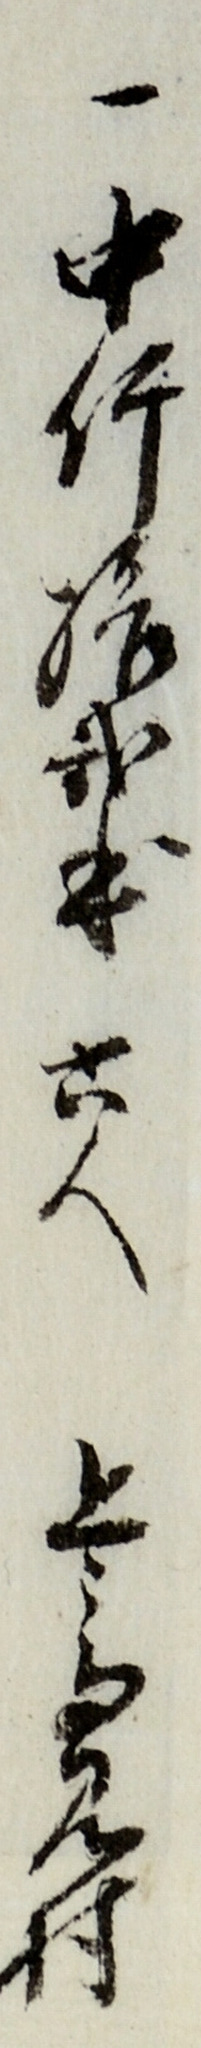一中竹拾弐本六人上高見村
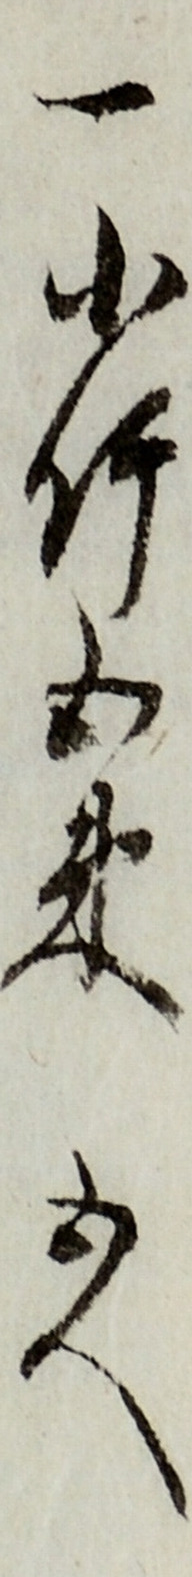一小竹五束五人
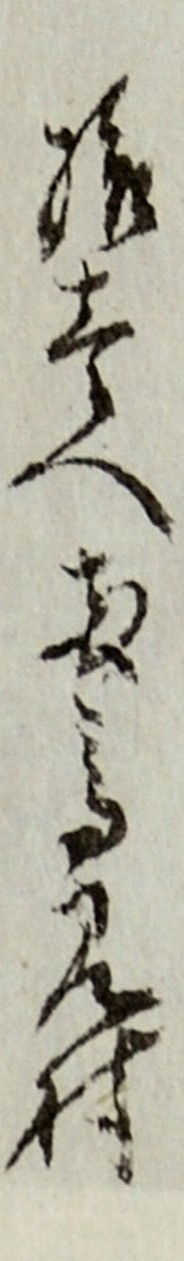拾壱人両高見村
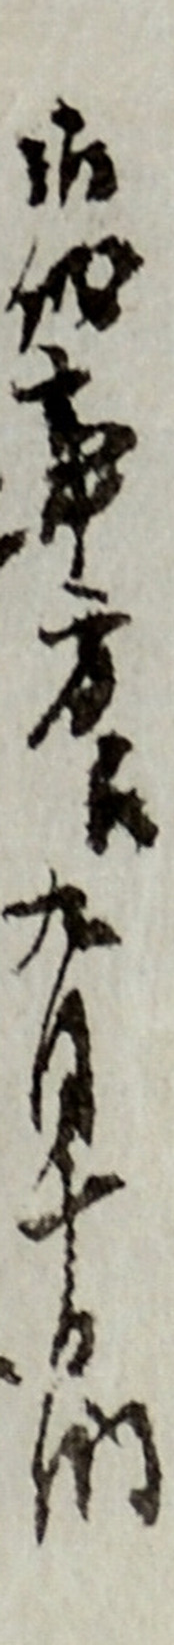御作事方江九月十日納
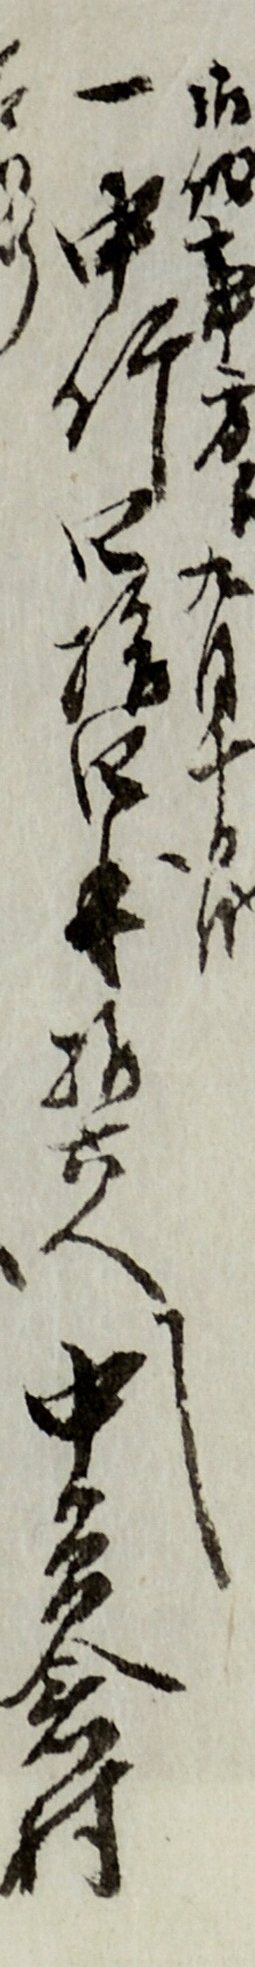一中竹四拾四本拾六人『中曾倉村
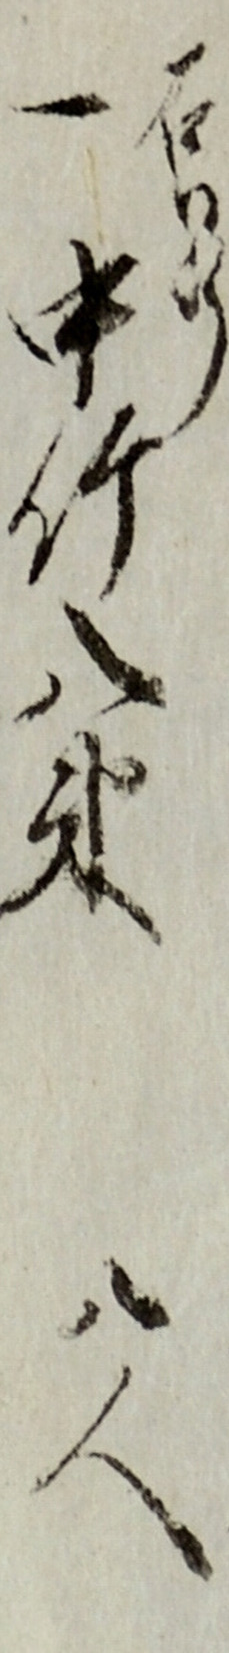一中竹八束八人
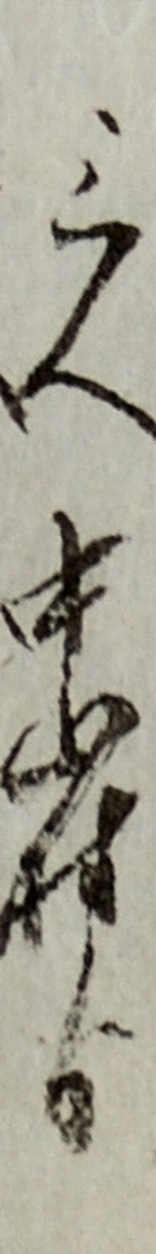三人中山村ゟ
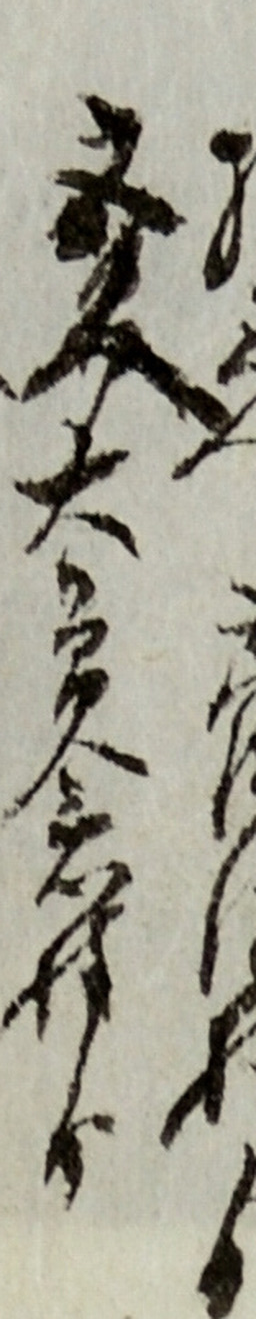五人大曾倉村ゟ
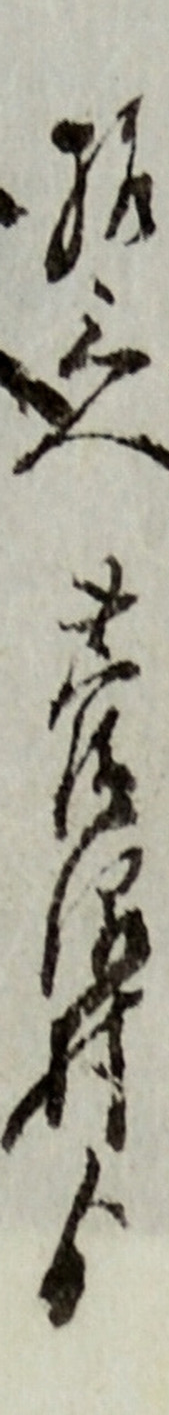拾三人菅沼村ゟ
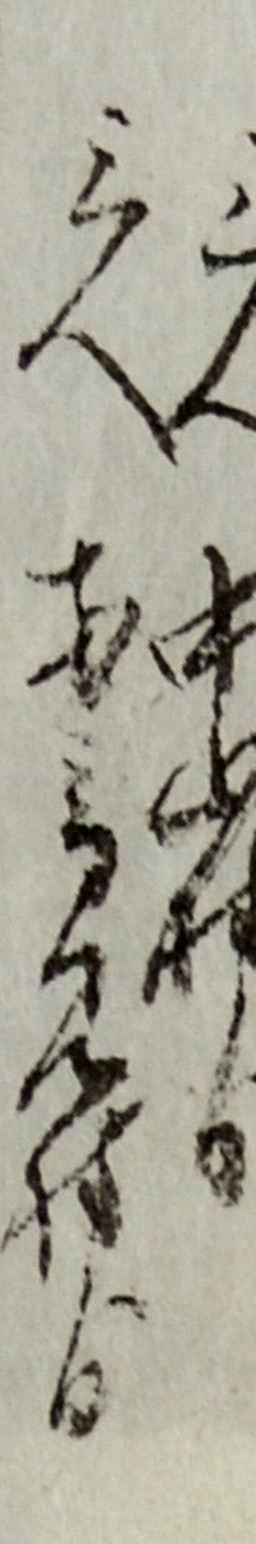三人両高見村ゟ

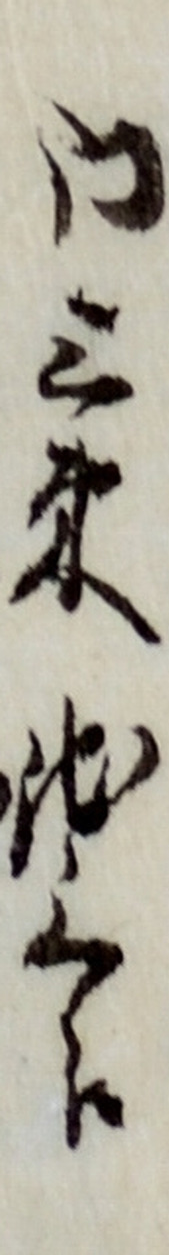内三束池上江
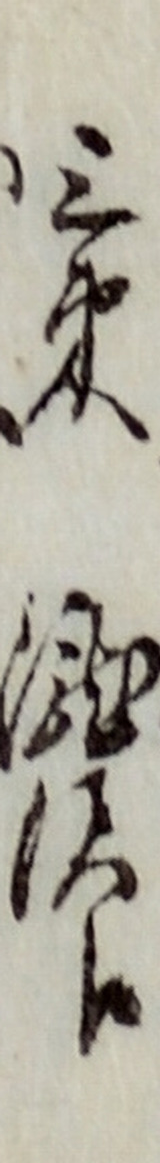三束滝沢江
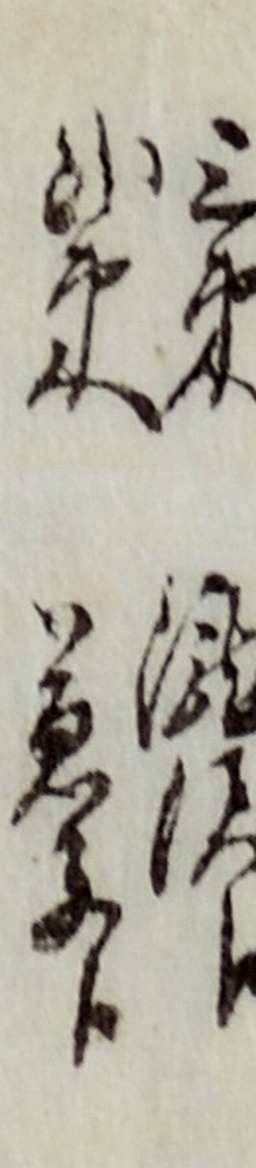二束兼子江
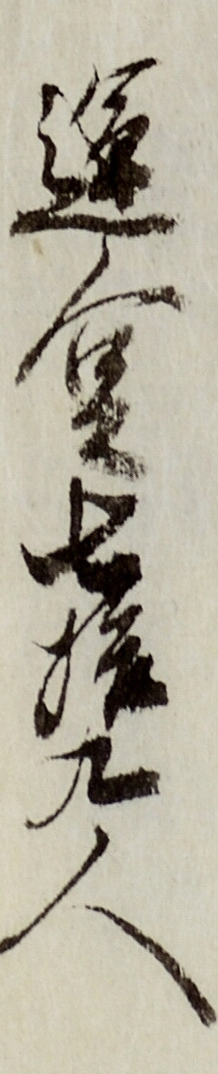運人足七拾九人

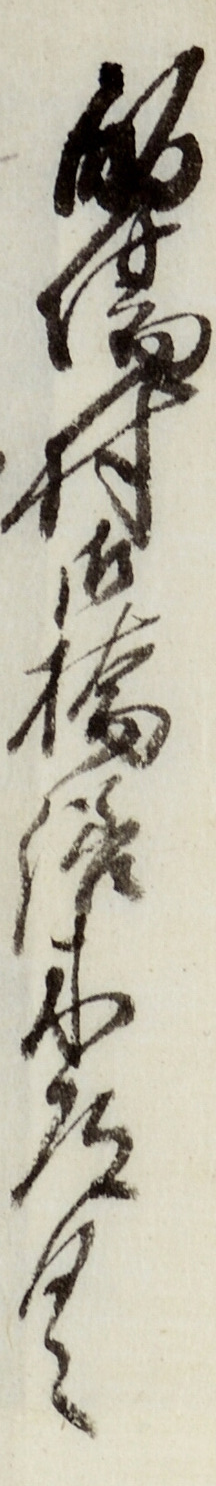的場村御橋繕木道具
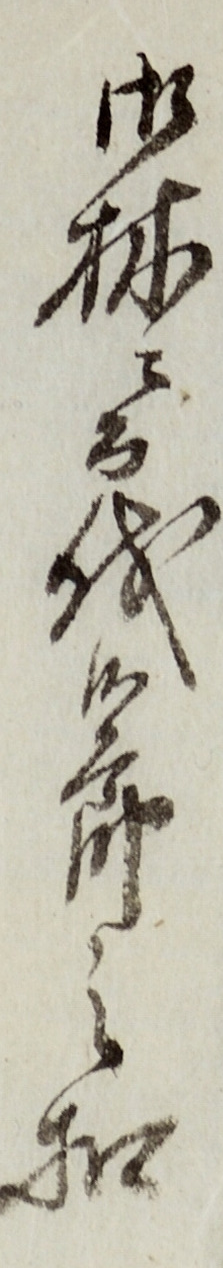御林ニ而伐候節之扣
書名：中沢郷御竹薮見廻り
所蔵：伊那市立高遠町図書館・合同会社AMANE
